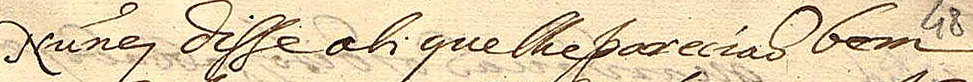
Nun̄ez disse ali que lhe pareçiaõ bem
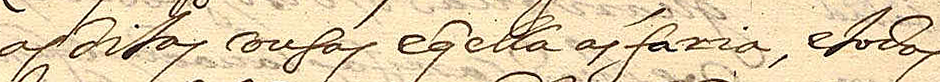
as ditas cousas e q̄ ella as faria, e todas
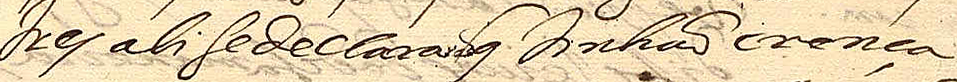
tres ali se declarara q̄ tinhaõ crença
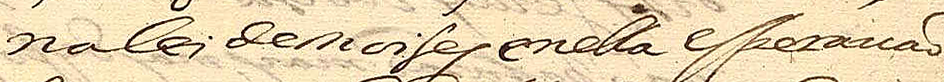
na lei de moises e nella esperauaõ
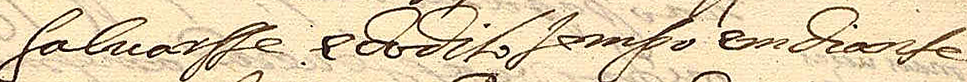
saluarsse e do dito tempo em diante
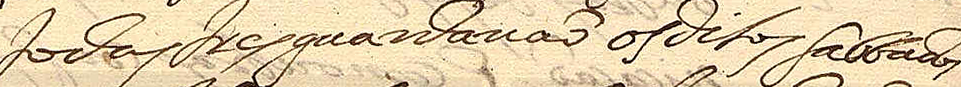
todas tres guardauaõ os ditos sabbados
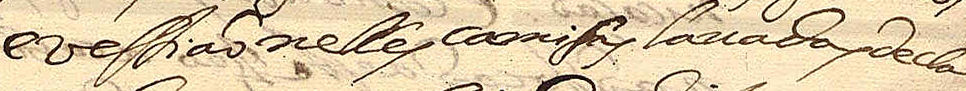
e vestiaõ nelles camisas lauadas decla
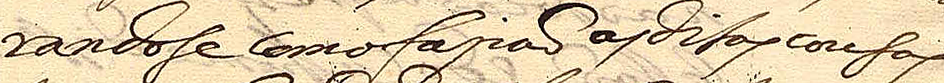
randose como faziaõ as ditas cousas
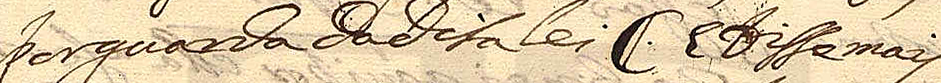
por guarda da dita lei ¶ E Disse mais
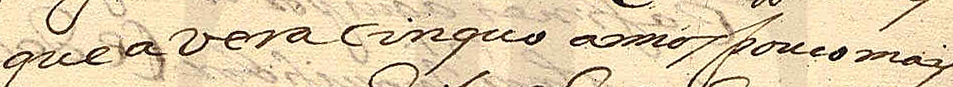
que avera cinquo annos pouco mais
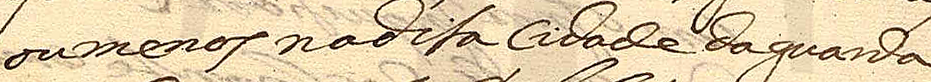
ou menos na dita Çidade da guarda
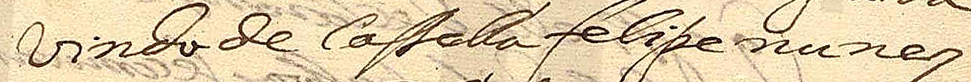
vindo de Castella felipe nunez
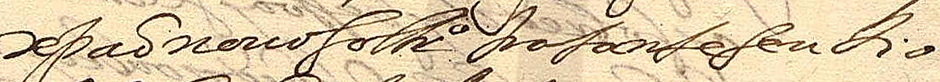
xpaõ nouo soltro tratante seu tio
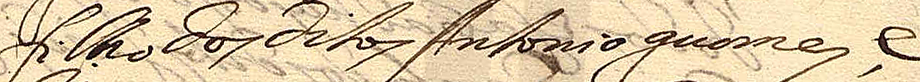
filho dos ditos Antonio guomez, e
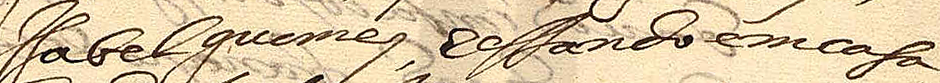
Jsabel guomez, e estando em casa
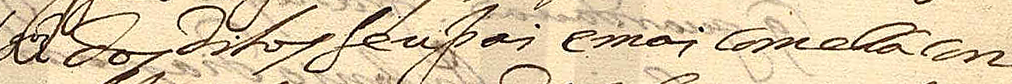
dos ditos seu pai e mai com ella con
